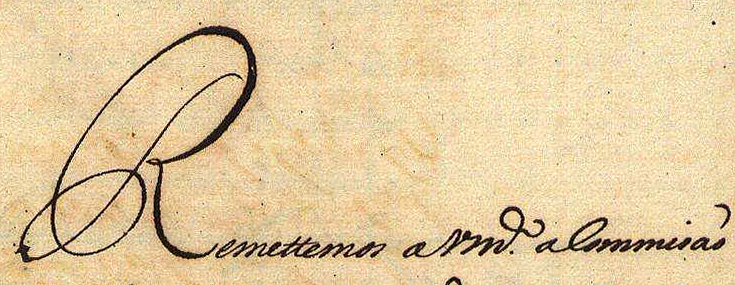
Remettemos a vmce a Commisaõ
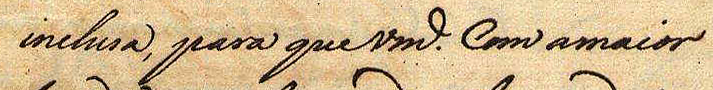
inclusa, para que vm.e com a maior
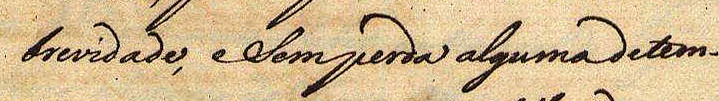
brevidade, e Sem perda alguma de tem
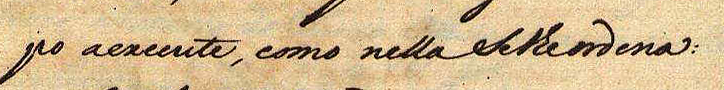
po a execute, como nella Se lhe ordena:
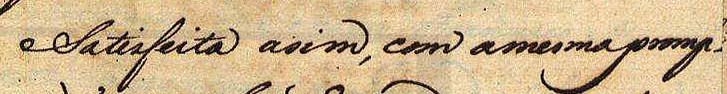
e Satisfeita asim, com a mesma promp
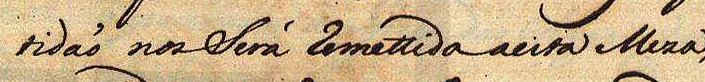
tidaõ noz Será Remettida a esta Meza,
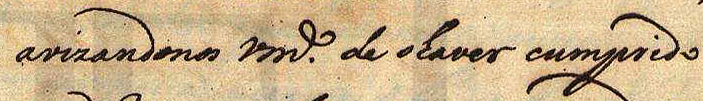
avizandonos vm.e de o haver cumprido
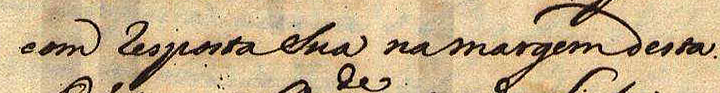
com Resposta Sua na margem desta.
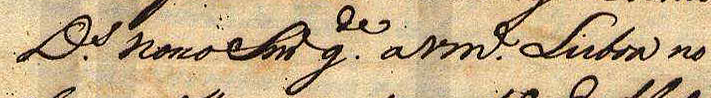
D.s nosso Snr̄ g.de a v m.e Lisboa no
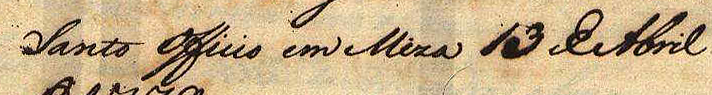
Santo Officio em Meza 13 d̄ Abril
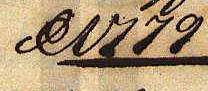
d̄ 1779
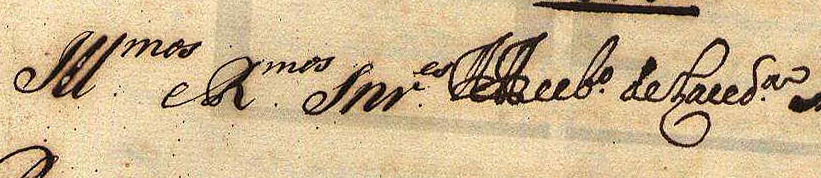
Ill.mos e R.mos Snr.es A Recb.o de Laced.a
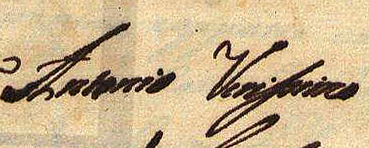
Antonio Verissimo
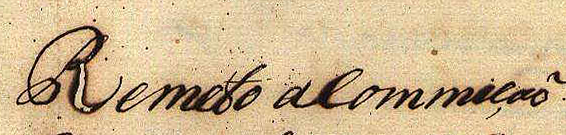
Remeto a commiçaõ
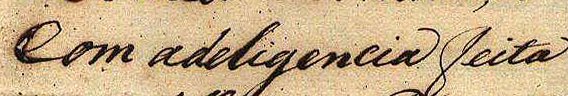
Com a deligencia feita
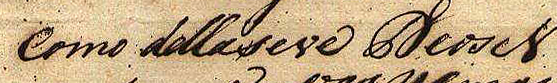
como della se ve Deos N.
